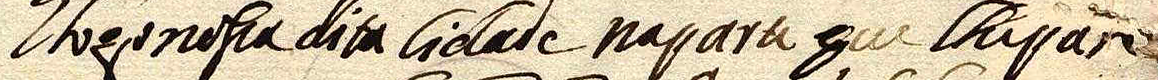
E logo nessa dita Cidade na parte que lhe pare
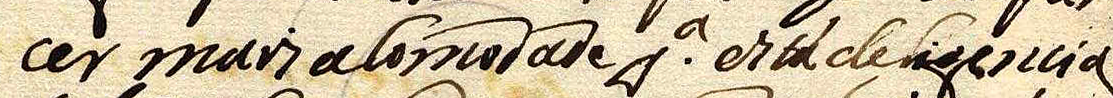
cer mais aComodade p.a esta deligencia
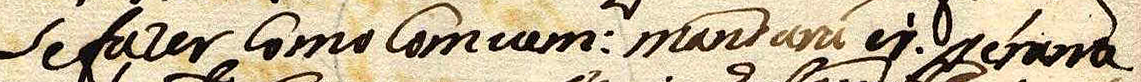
se fazer como comuem: mandará ir perante
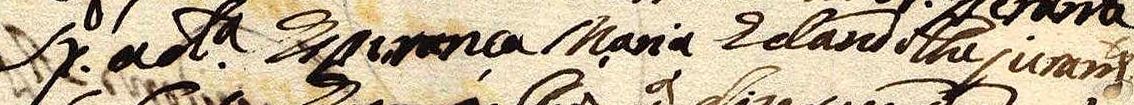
Sy. a d̄.a Esperança Maria E dandolhe juramto
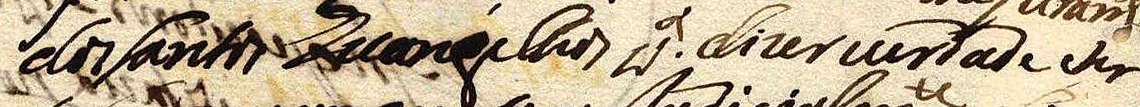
dos santos Euangelhos p.a dizer uerdade ter
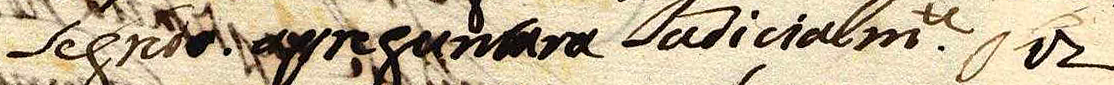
segredo a preguntará Iudicialm.te por
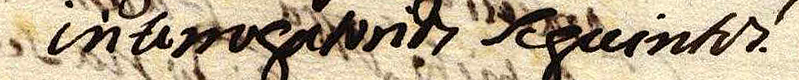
interrogatorios seguintes.
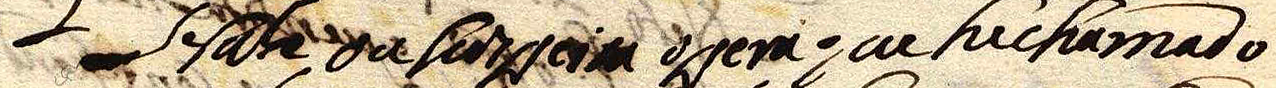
1 Se sabe ou suspeita o pera que he chamado
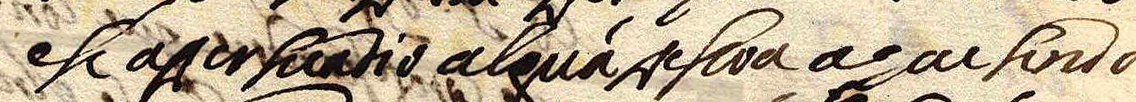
e se a persuadio alguā pessoa a que sendo
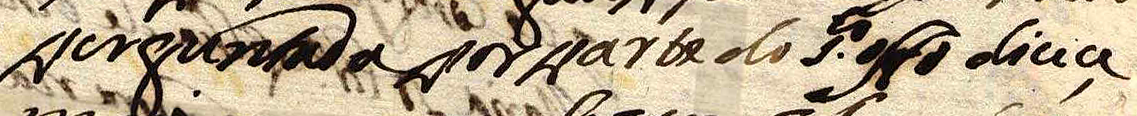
perguntada por parte do s.to offo diceçe
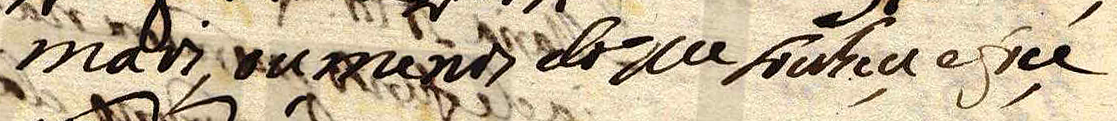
mais, ou menos do que soubeçe e foçe
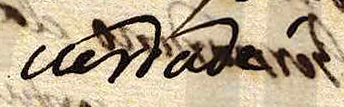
uerdade?
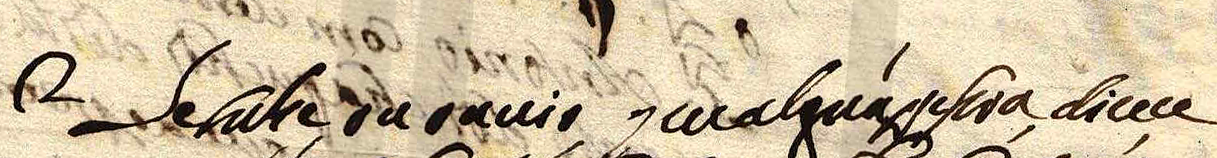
2 Se sabe, ou ouuio que alguā pessoa, diceçe
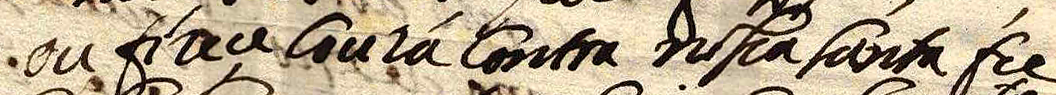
ou fizeçe couza contra nossa santa fee
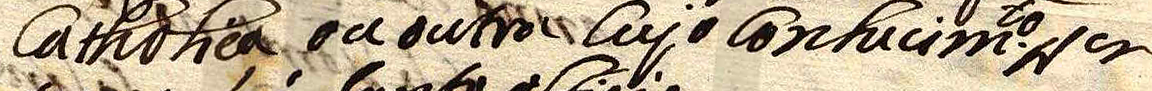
Catholica, ou outra Cujo conhecim.to per
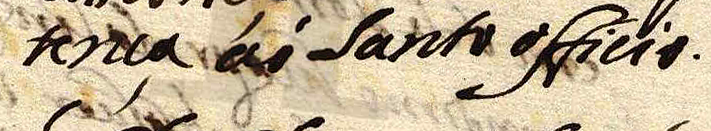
tença ao Santo officio.
